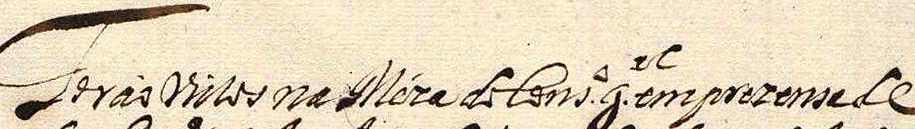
Forão vistos na Meza do Cons.o g.al em prezensa de
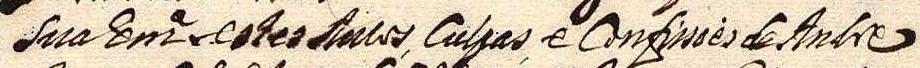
sua Ema estes Autos, Culpas, e Confissoẽs de Andre
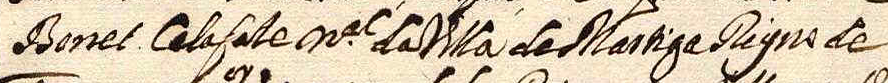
Bonet Calafate n.al da Villa de Martiga Reyno de
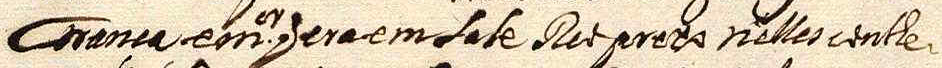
França e m.or q̄ era em sale Reo prezo nelles conthe
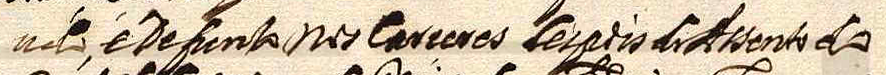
udo, e Defunto nos Carceres despois de Assento do
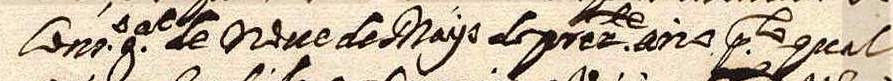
Cons.o g.al de noue de Mayo do prez.te ano p.lo qual
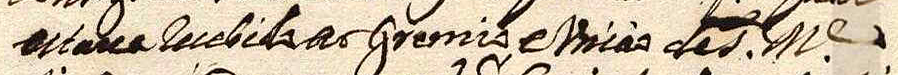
estaua Recebido ao Gremio, e Vnião de s.ta M.e
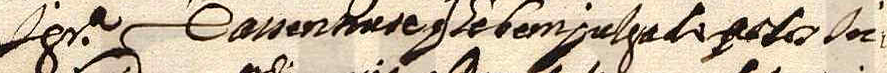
Igr.a E assentouse q̄ he bem julgado pelos In
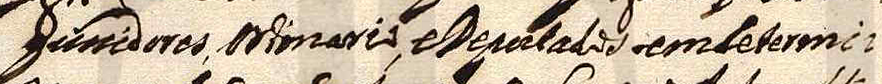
quisidores, ordinario, e Deputados em determi
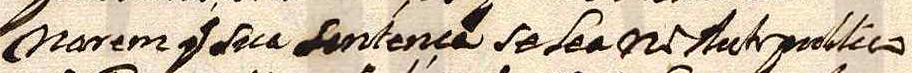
narem q̄ sua sentença se lea no Auto publico
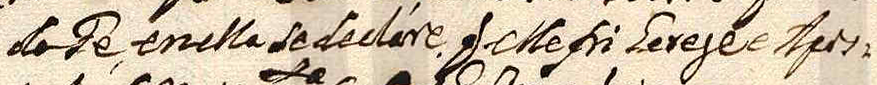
da Fe, e nella se declare, q̄ elle foi herege Apos
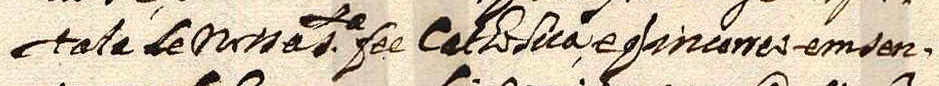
tata de nossa s.ta fee Catholica, e q̄ incorreo em sen
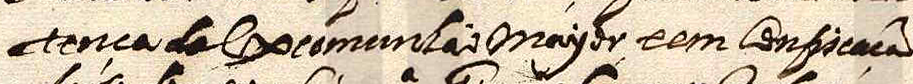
tença da Excomunhaõ mayor, e em confiscaçaõ
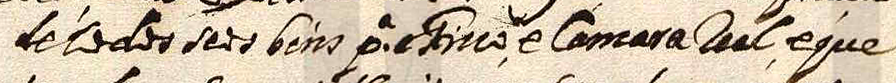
de todos seos bens p.a o Fisco, e Camara Real, e que
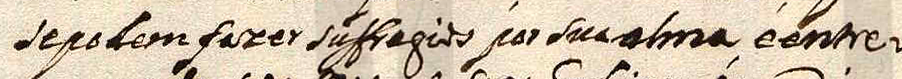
se podem fazer suffragios por sua alma, e entre
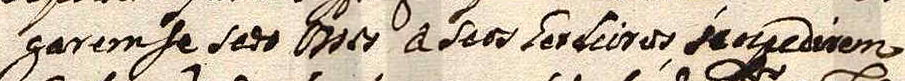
garemse seos ossos a seos herdeiros, se os pedirem
